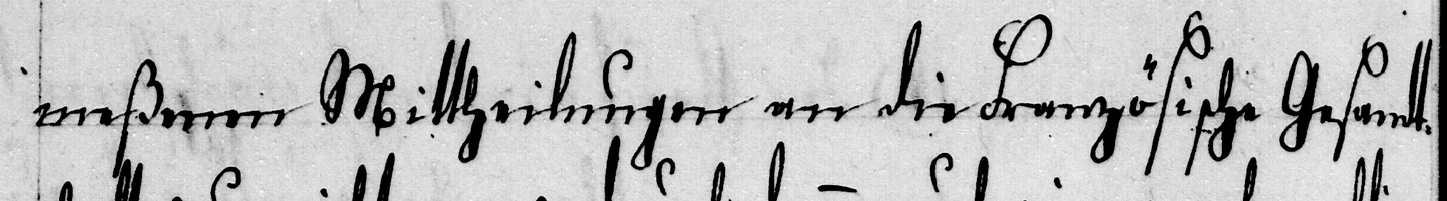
meßenen Mittheilungen an die Französische Gesan¬
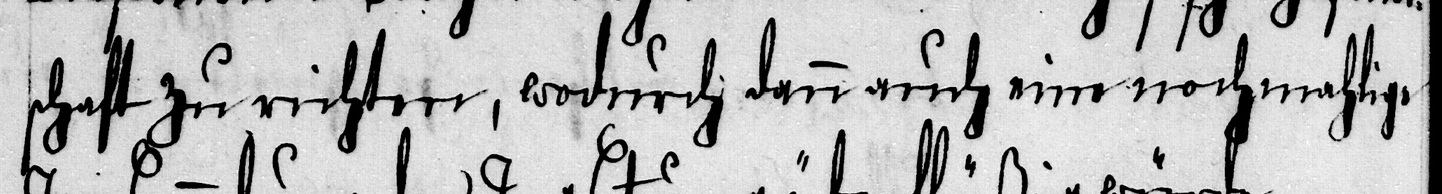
schaft zu richten, wodurch dann auch eine nochmahlige
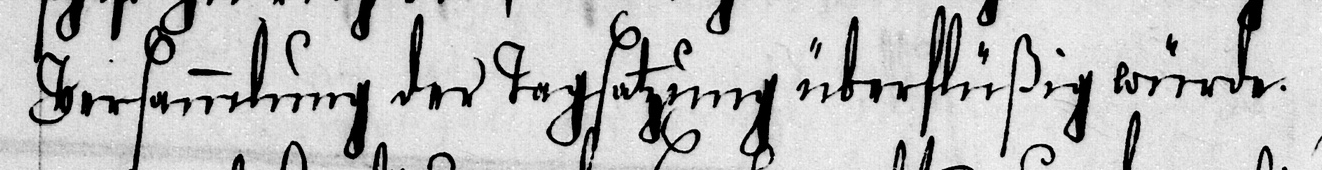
Versammlung der Tagsatzung überflüßig würde.
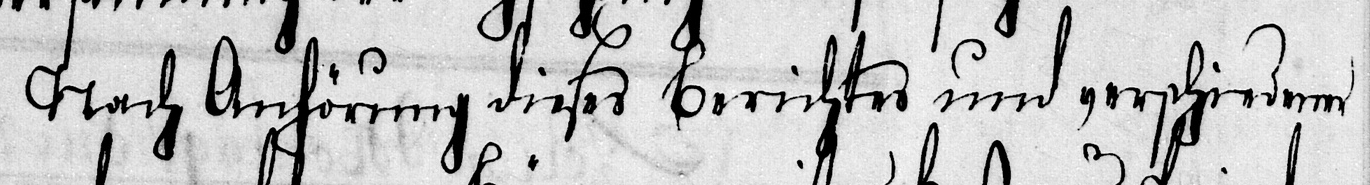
Nach Anhörung dieses Berichtes und verschiedener
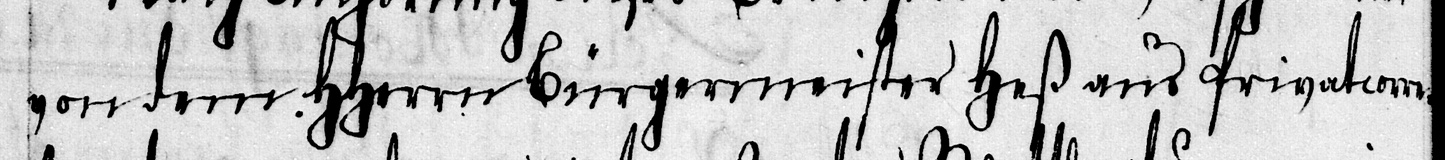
von dem HHerrn Bürgermeister Heß aus Privatcor¬
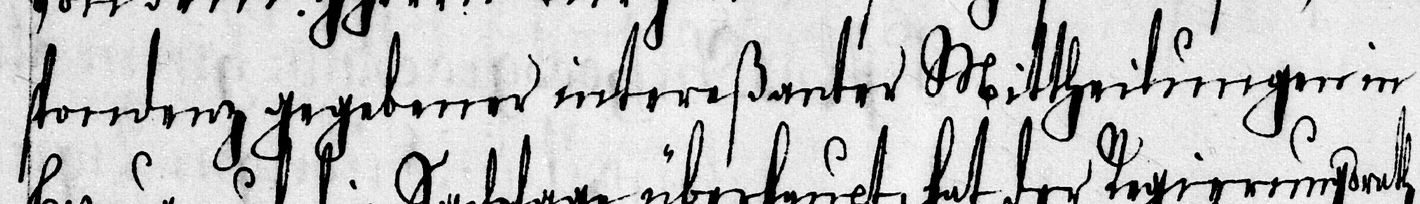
spondenz gegebener intereßanter Mittheilungen in
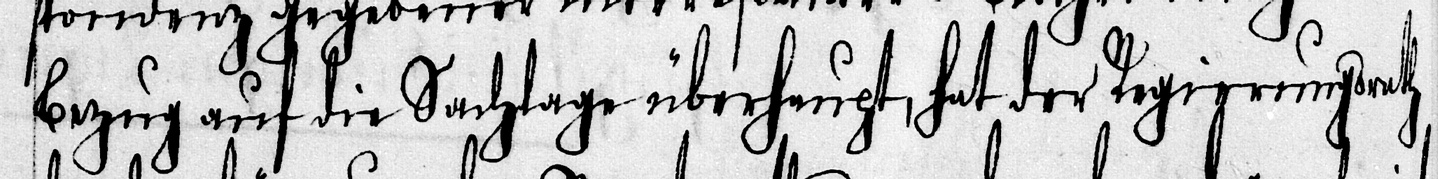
Bezug auf die Sachlage überhaupt, hat der Regierungsra¬
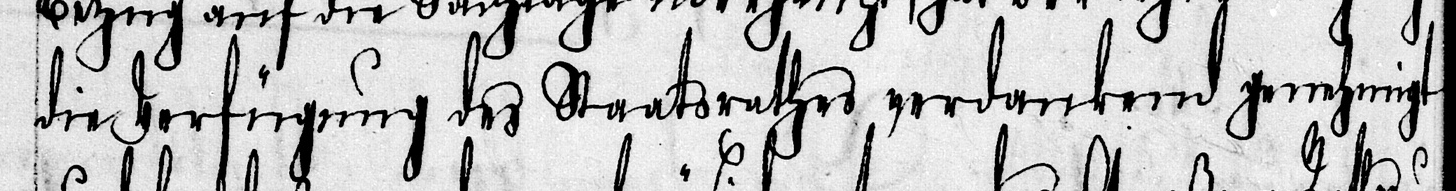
die Verfügung des Staatsrathes verdankend genehmigt
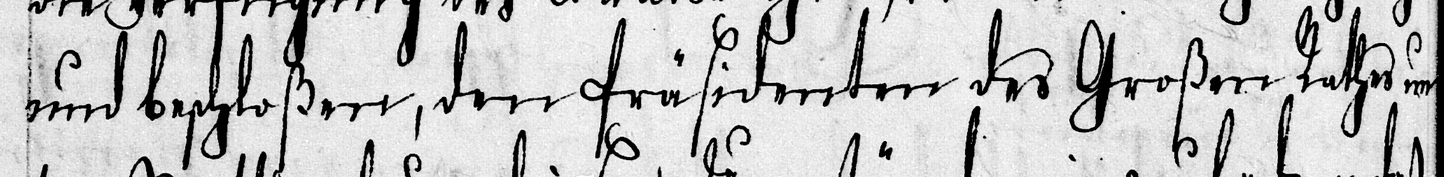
und beschloßen, den Präsident des Großen Rathes
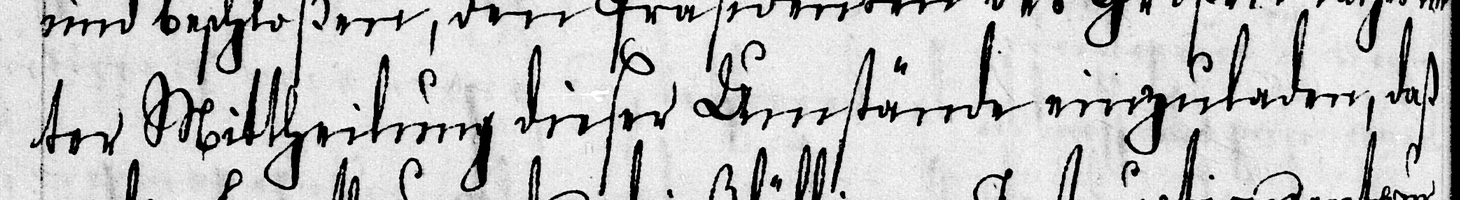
ter Mittheilung dieser Umstände einzuladen, daß
